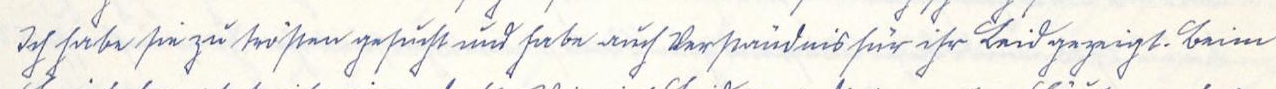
Ich habe sie zu trösten gesucht und habe auch Verständnis für ihr Leid gezeigt. Beim
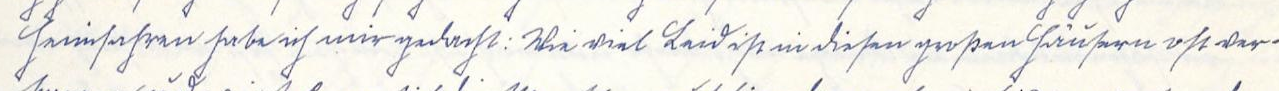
Heimfahren habe ich mir gedacht: Wie viel Leid ist in diesen großen Häusern oft ver
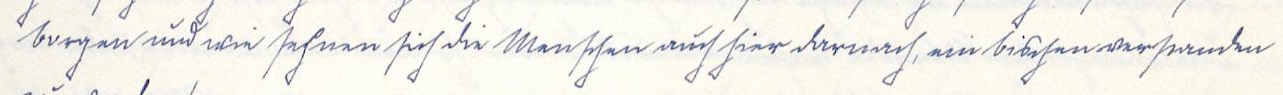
borgen und wie sehnen sich die Menschen auch hier darnach, ein bischen verstanden
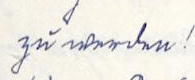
zu werden!...
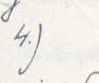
4)
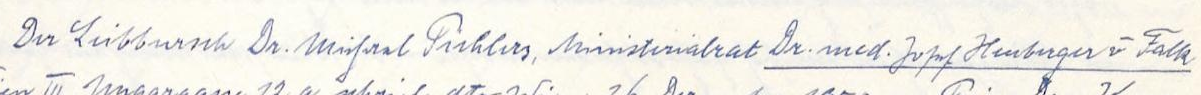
Der Leibbursch Dr. Michael Pichlers, Ministerialrat Dr. med. Josef Hamberger v/o Falk
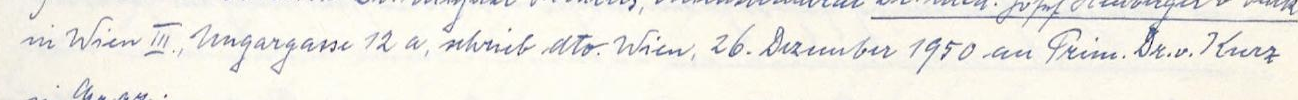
in Wien III, Ungargasse 12 a, schrieb dto. Wien, 26. Dezember 1950 an Prim. Dr. v. Kurz
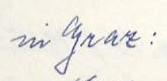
in Graz:
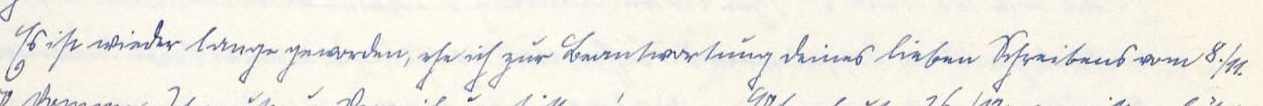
Es ist wieder lange geworden, ehe ich zur Beantwortung deines lieben Schreibens vom 8./11
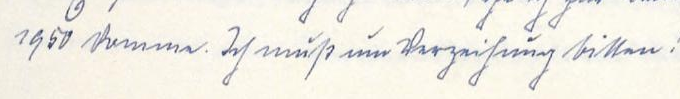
1950 komme. Ich muss um Verzeihung bitten!
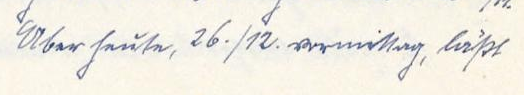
Aber heute, 26. /12. Vormittag, lässt
